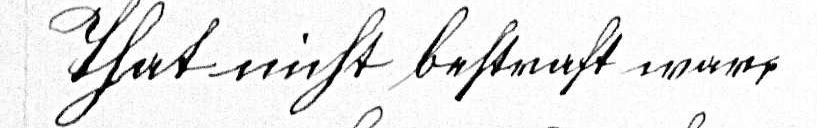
That nicht bestraft war.
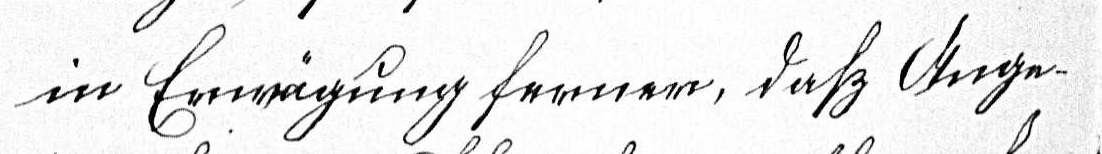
In Erwägung ferner, daß Ange¬
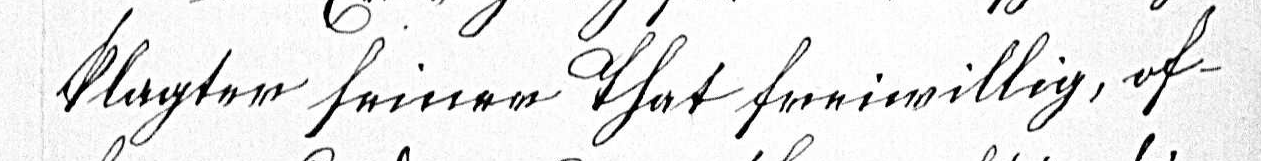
klagter seiner That freiwillig, of¬
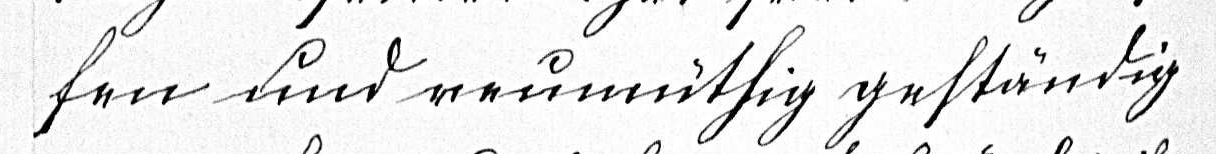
fen und reumüthig geständig
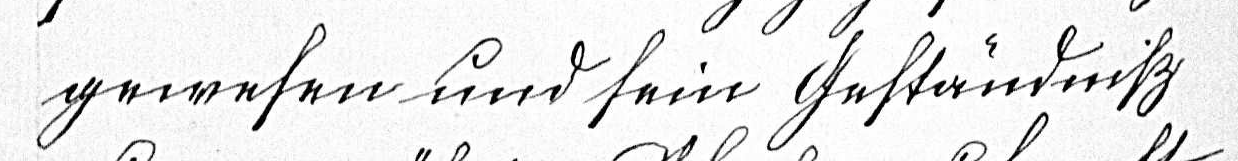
gewesen und sein Geständniß
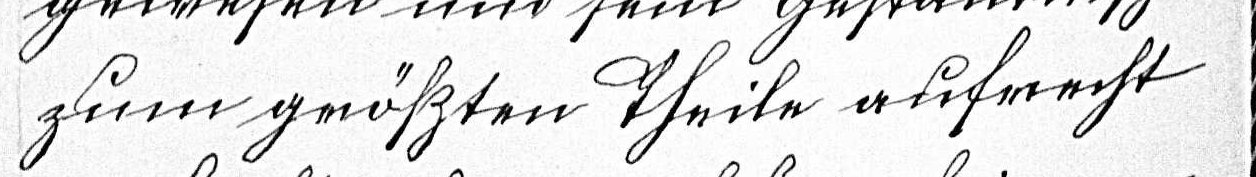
zum größten Theile aufrecht
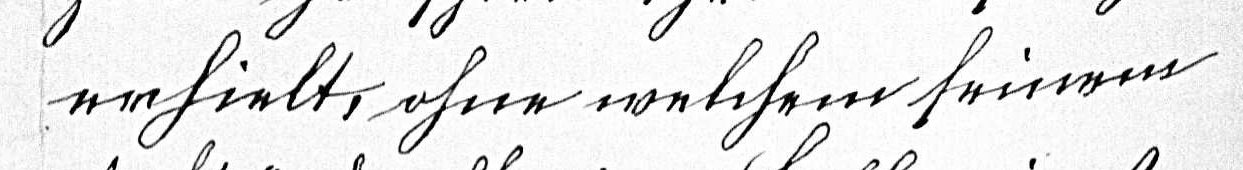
erhielt, ohne welchem seinem
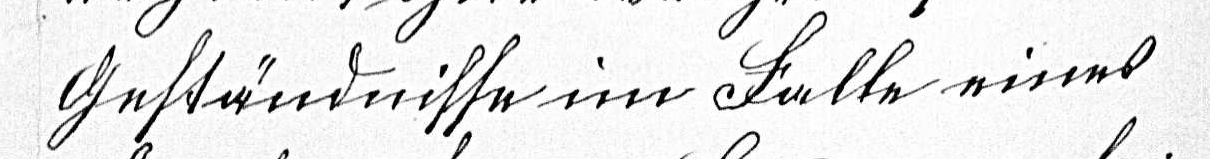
Geständnisse im Falle eines
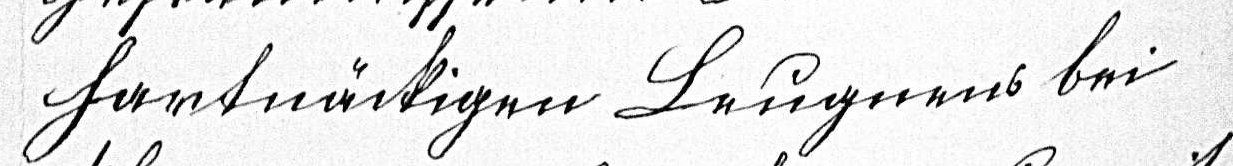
hartnäckigen Leugnens bei
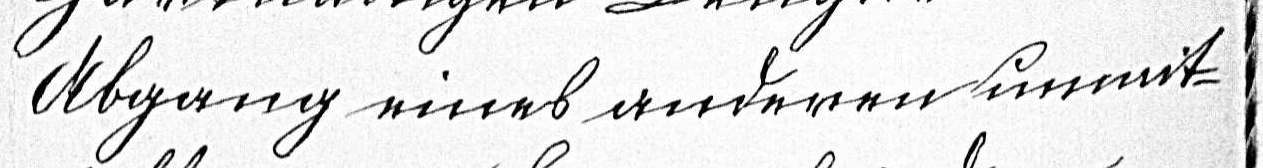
Abgang eines anderen unmit¬
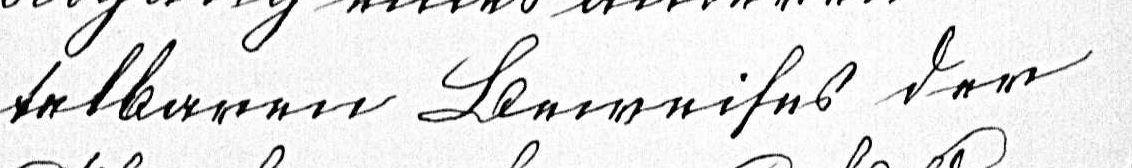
telbaren Beweises der
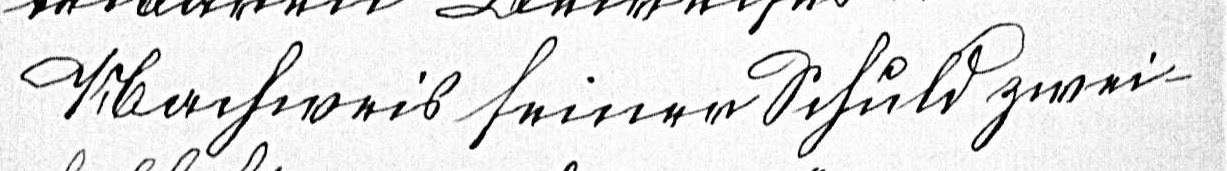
Nachweis seiner Schuld zwei¬
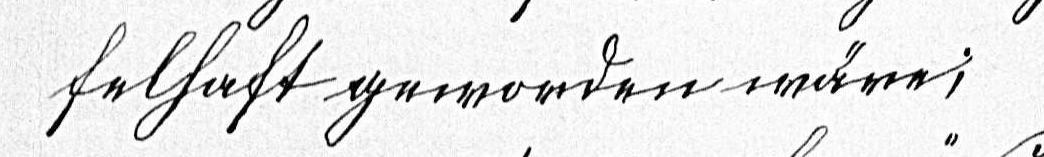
felhaft geworden wäre;
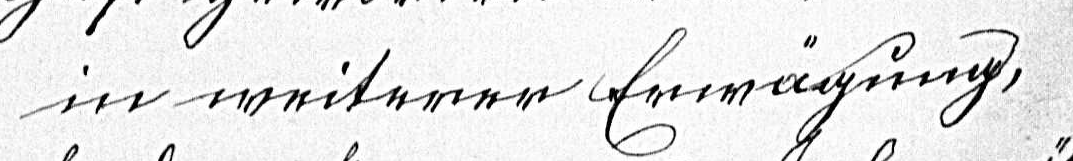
In weiterer Erwägung,
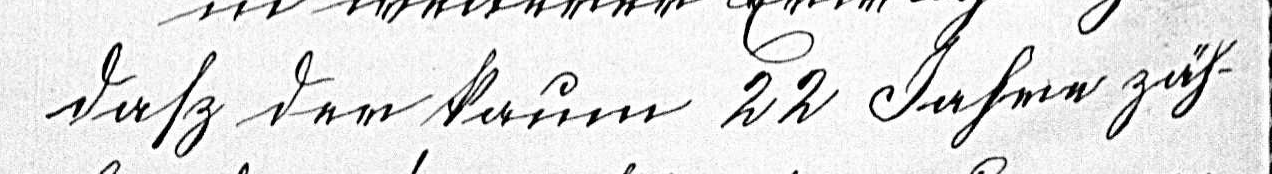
daß der kaum 22 Jahre zäh¬
